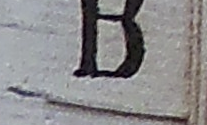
B
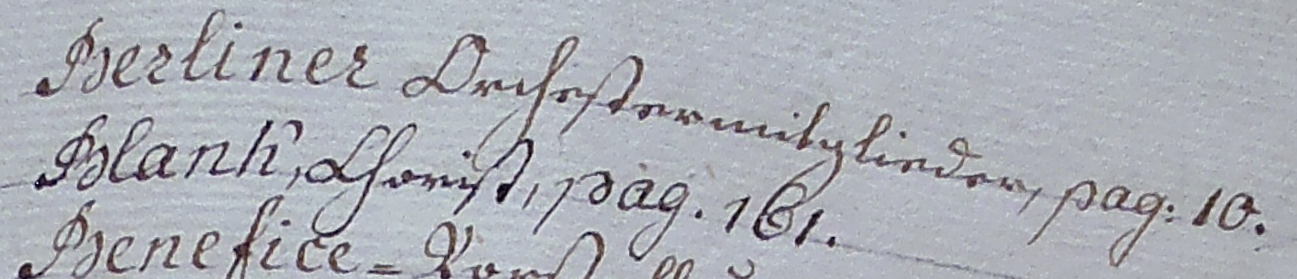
Berliner Orchestermitglieder, pag. 10.
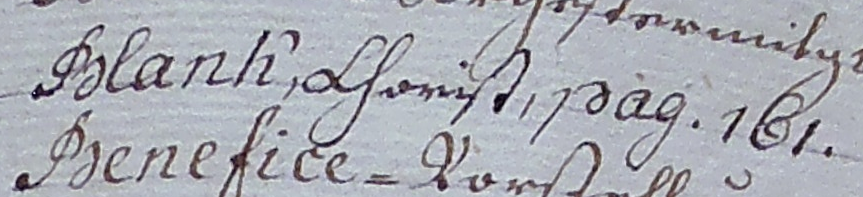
Blank, Chorist, pag. 161.
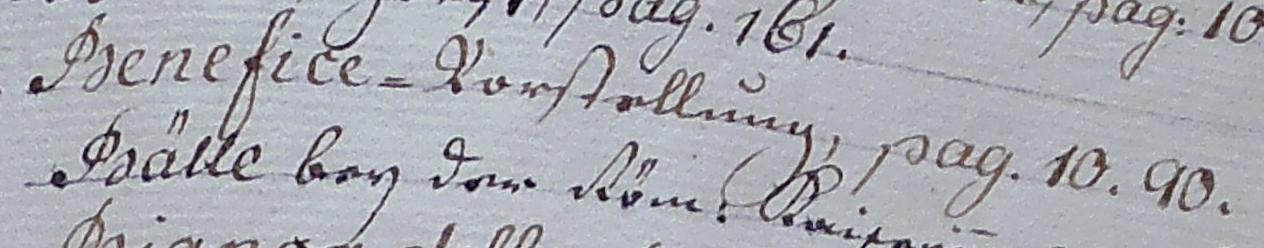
Benefice=Vorstellung, pag. 10. 90.
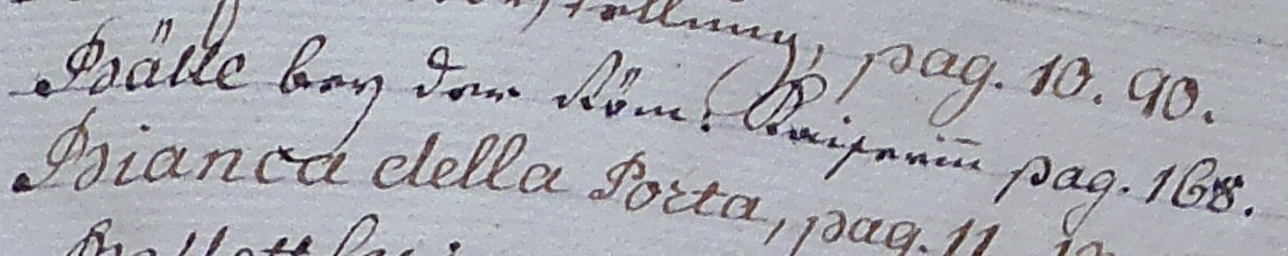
Bälle bey der Röm. Kaiserin̅, pag. 168.
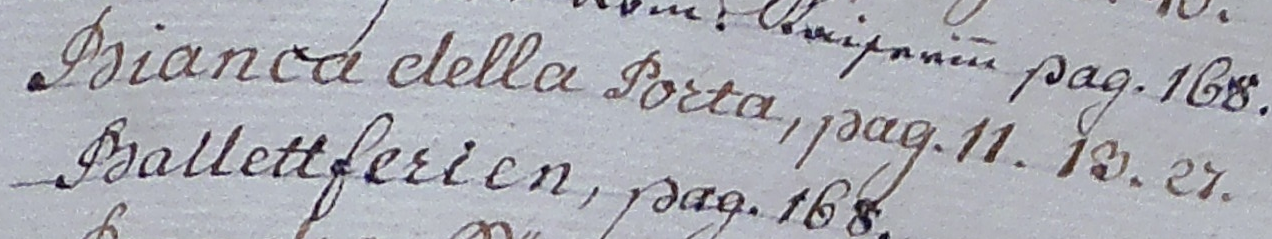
Bianca della Porta, pag. 11. 13. 27.
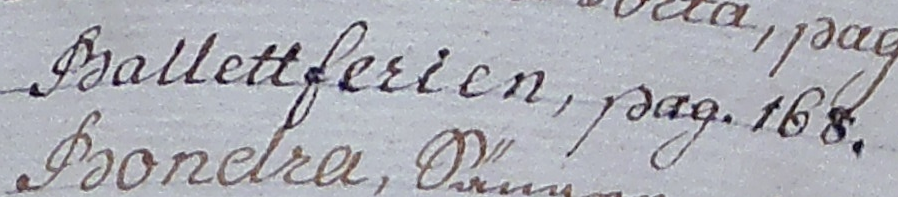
Ballettferien, pag. 168.
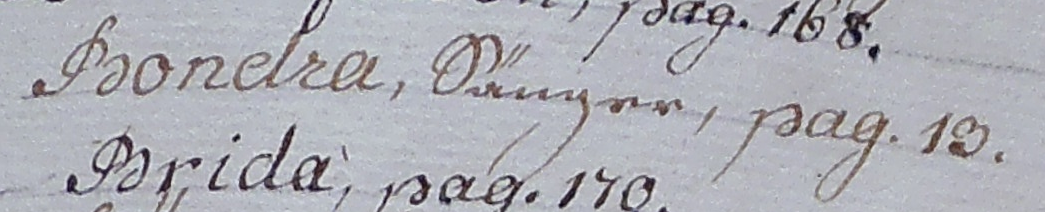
Bondra, Sänger, pag. 13.
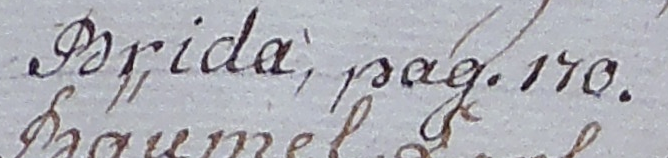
Brida, pag. 170.
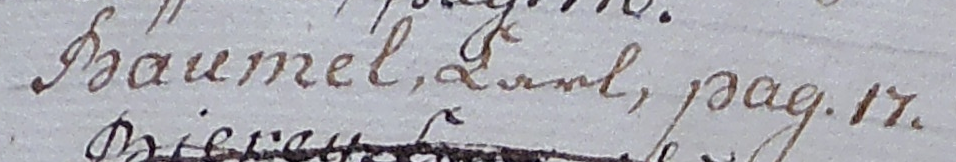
Bäumel, Carl, pag. 17.
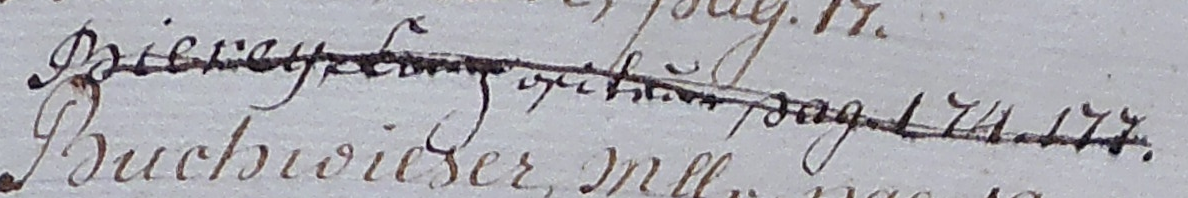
Bierey, Compositeur pag. 174. 177.
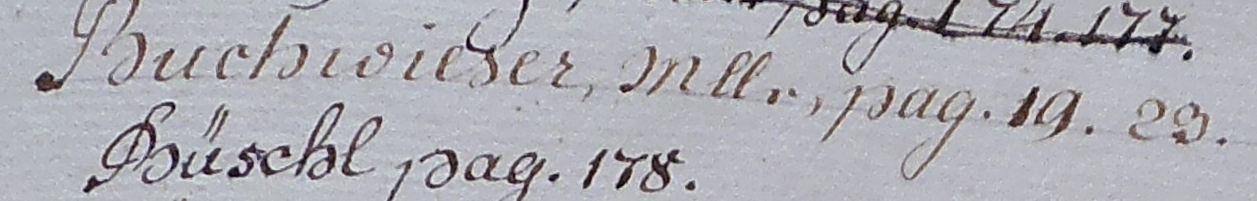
Buchwieser, Mlle, pag. 19. 23.
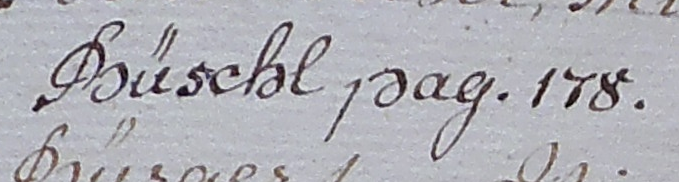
Büschl pag. 178.
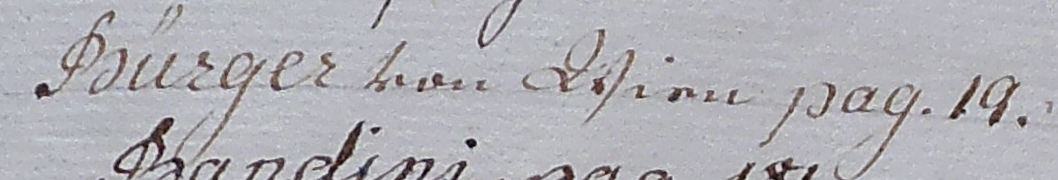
Bürger von Wien pag. 19.
